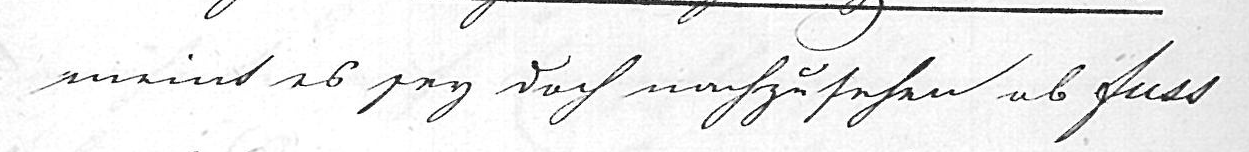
meint es sey doch nachzusehen ob Fuss
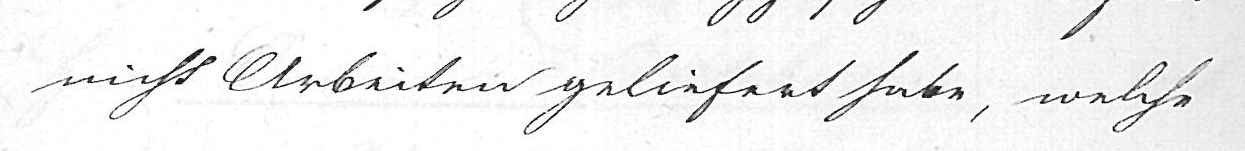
nicht Arbeiten geliefert habe, welche
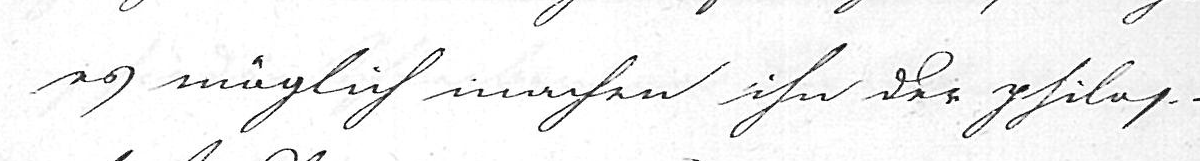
es möglich machen ihn der philos.-
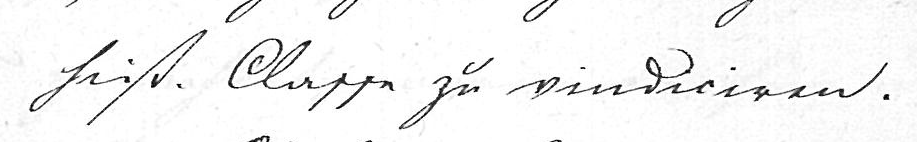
hist. Classe zu vindiciren.
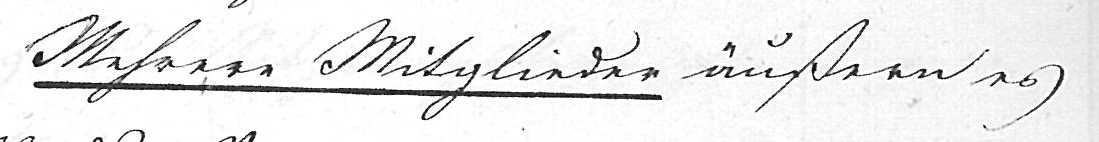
Mehrere Mitglieder äußern es
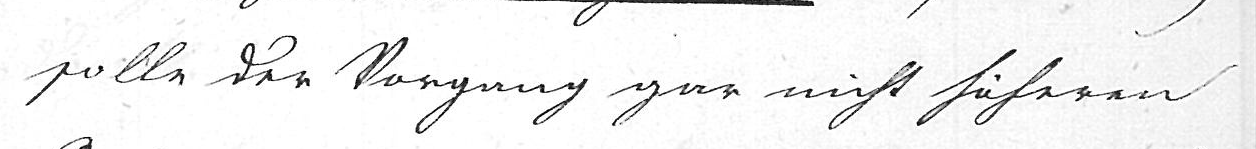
solle der Vorgang gar nicht höheren
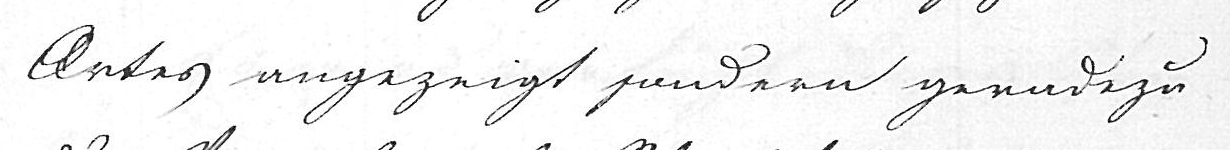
Ortes angezeigt sondern geradezu
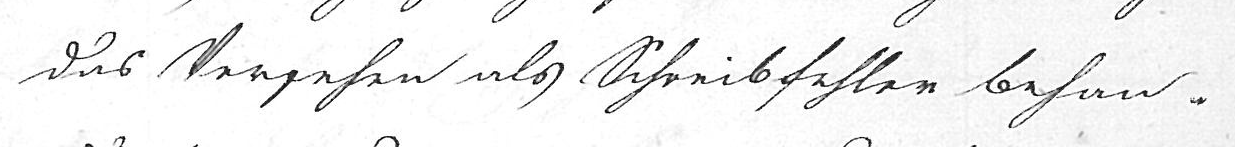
das versehen als Schreibfehler behan-
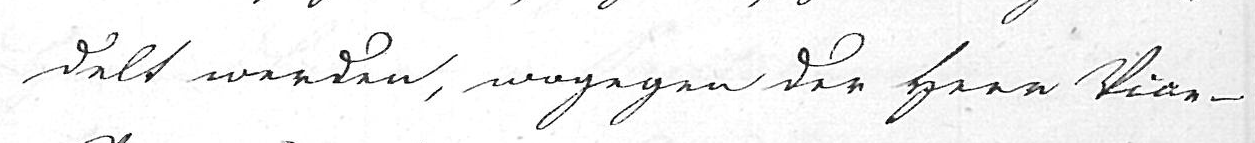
delt werden, wogegen der Herr Vice-
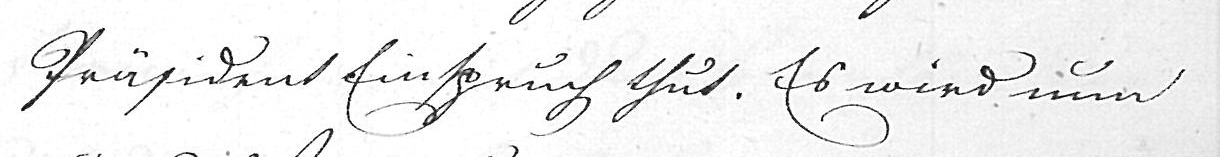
Präsident Einspruch thut. Es wird nun
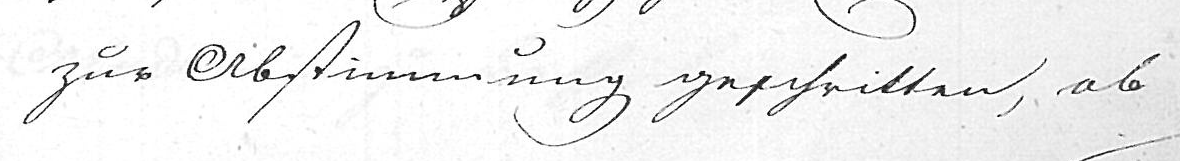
zur Abstimmung geschritten, ob
